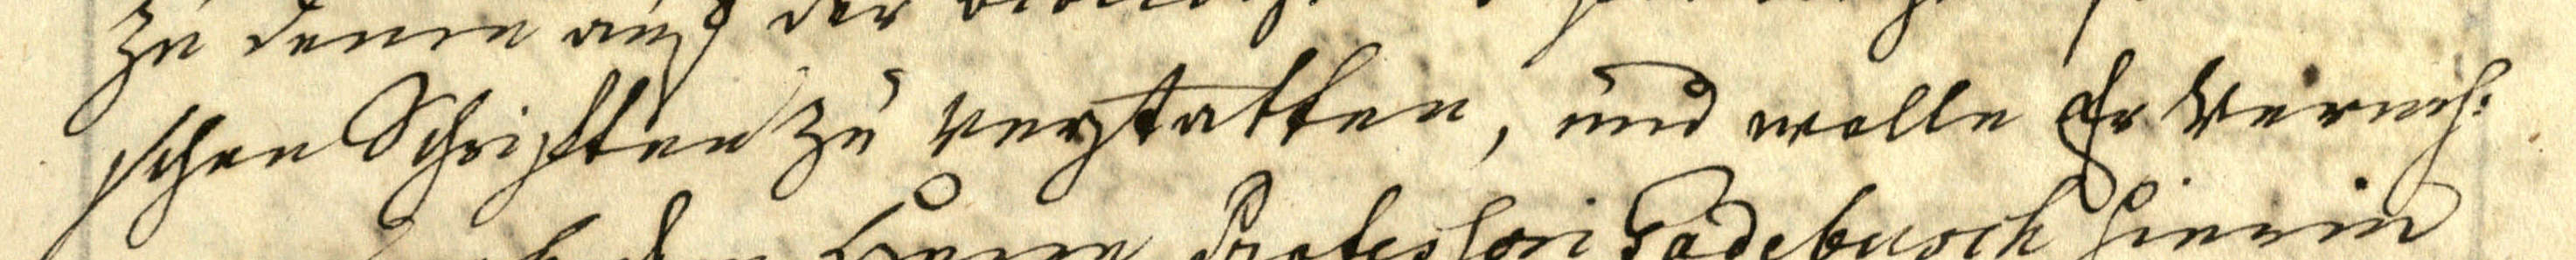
schen Schriften zu verstatten, und wolle Er verneh¬
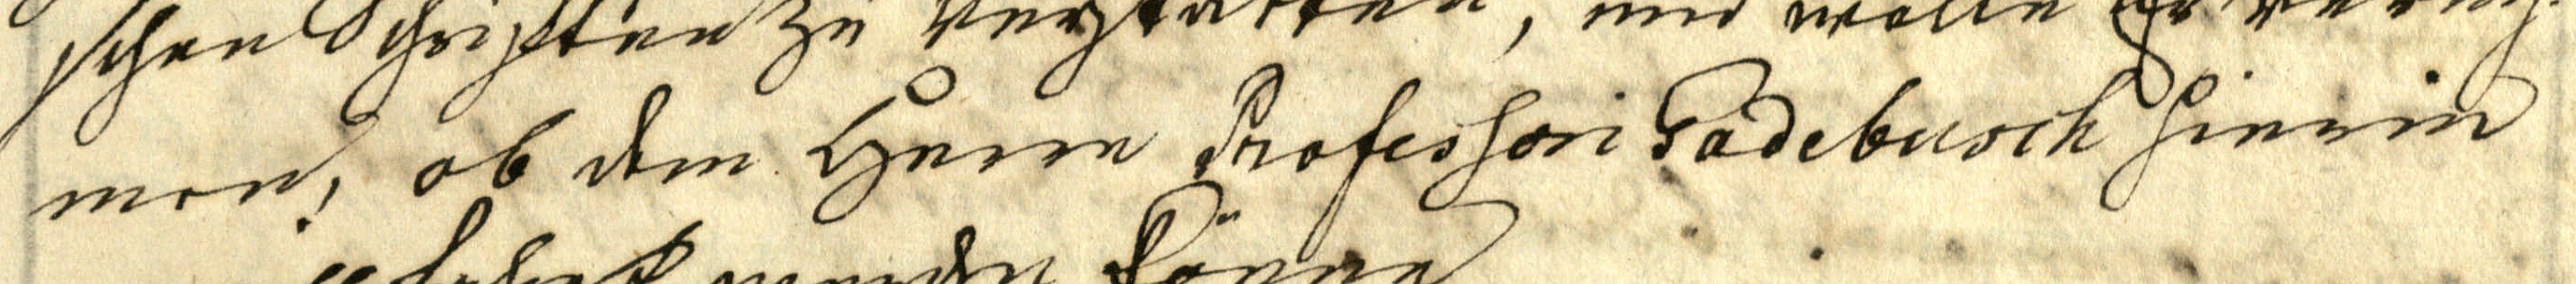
men, ob dem Herrn Professori Gadebusch hierin
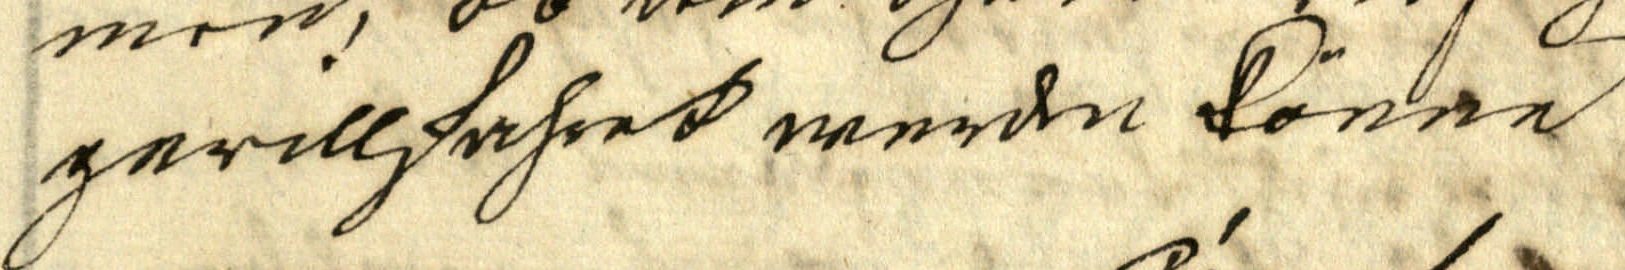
gewillfahret werden könne
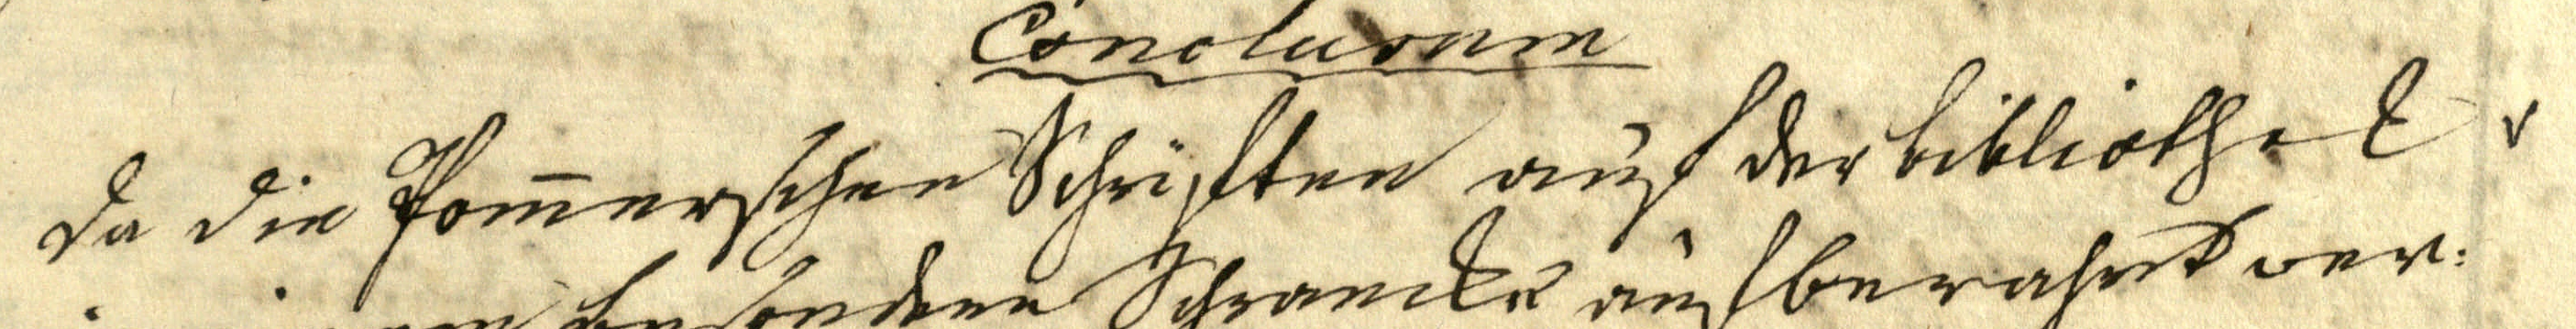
Da die Pomerschen Schriften auf der Bibliothek
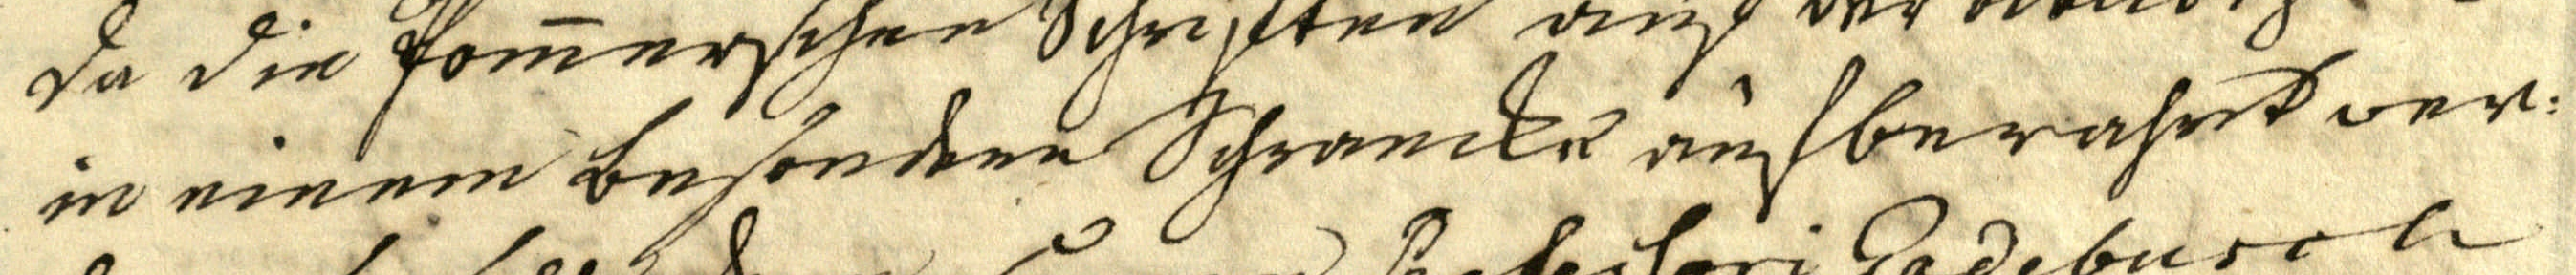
in einem besondern Schranke aufbewahret wer¬
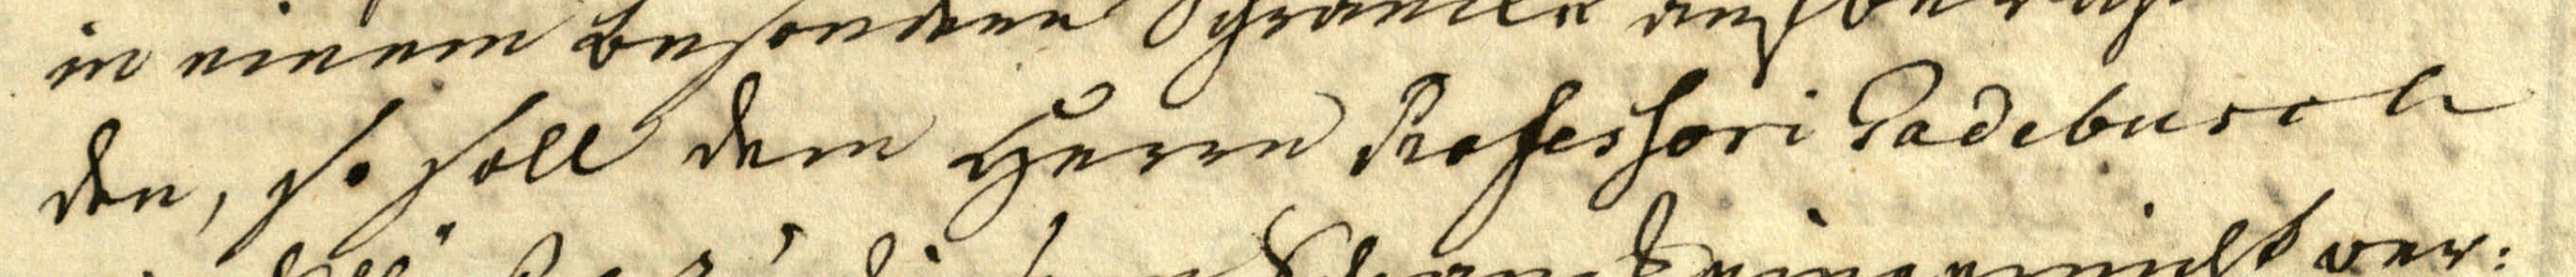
den, so soll dem Herrn Professori Gadebusch
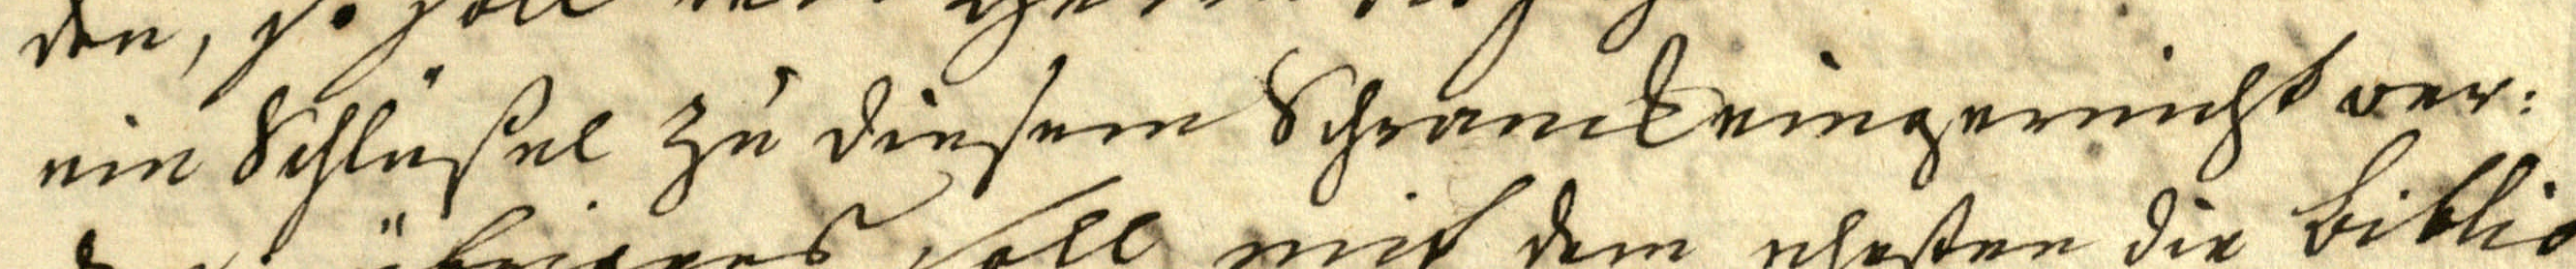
ein Schlüßel zu diesem Schrank eingereicht wer¬
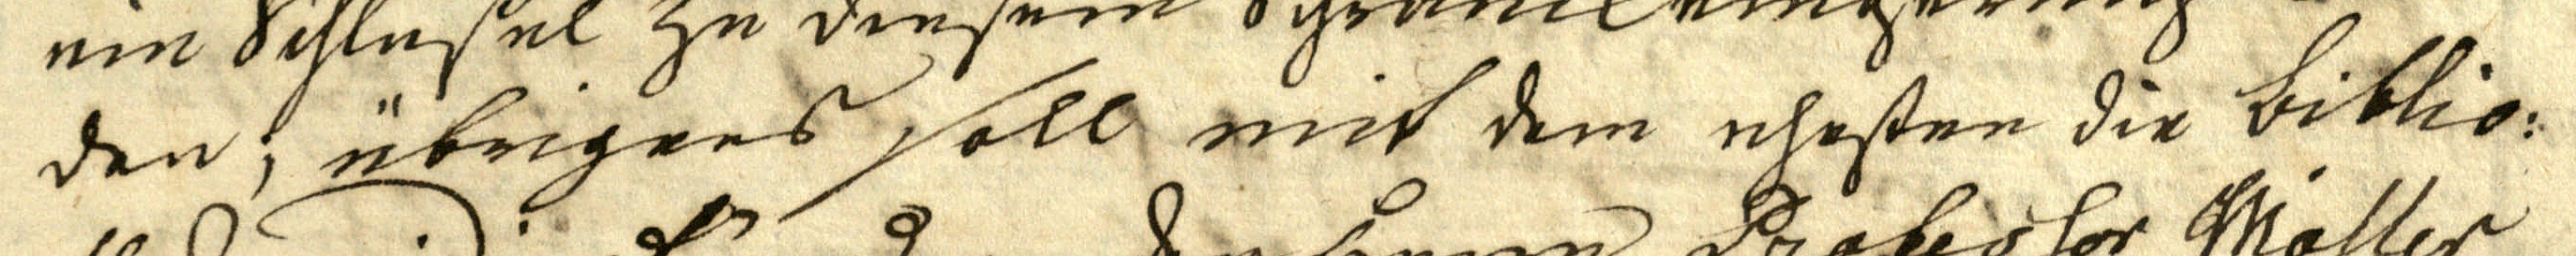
den, übrigens soll mit dem ehesten die Biblio¬
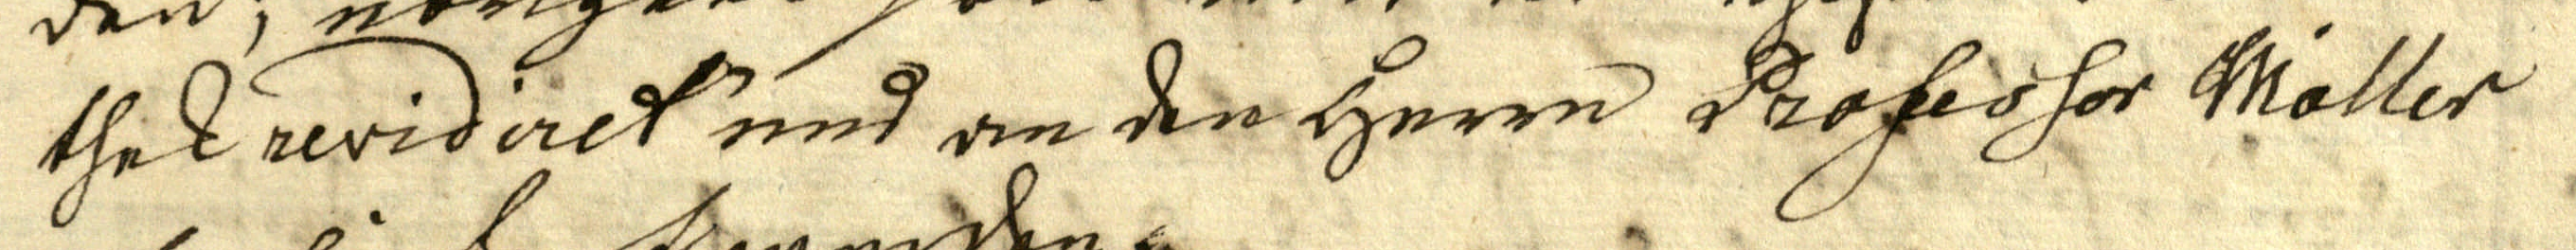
thek revidiret und an den Herrn Professor Möller
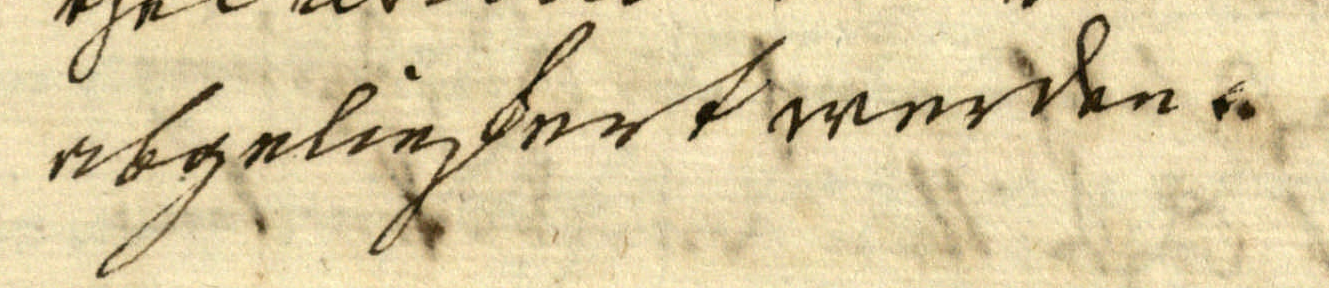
abgeliefert werden an
